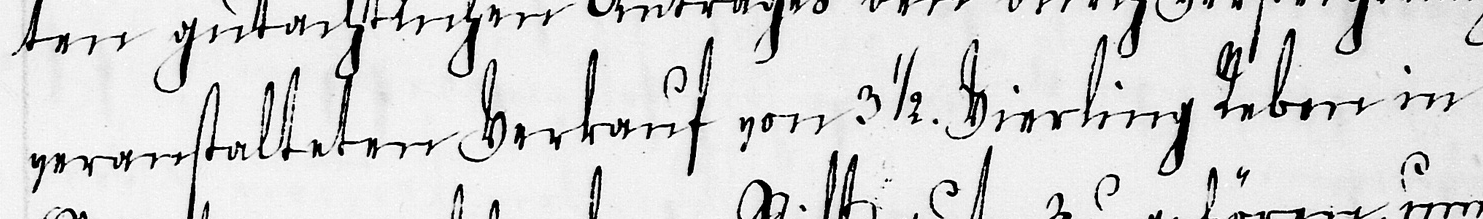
veranstalteten Verkauf von 3 ½. Vierling Reben in
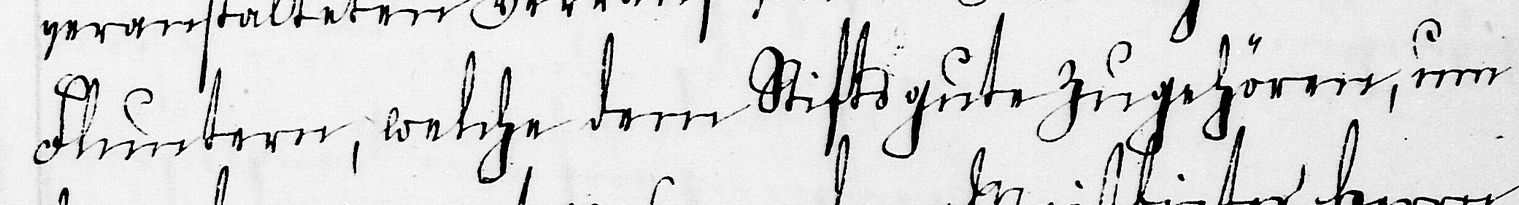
Fluntern, welche dem Stiftsgute zugehören, um
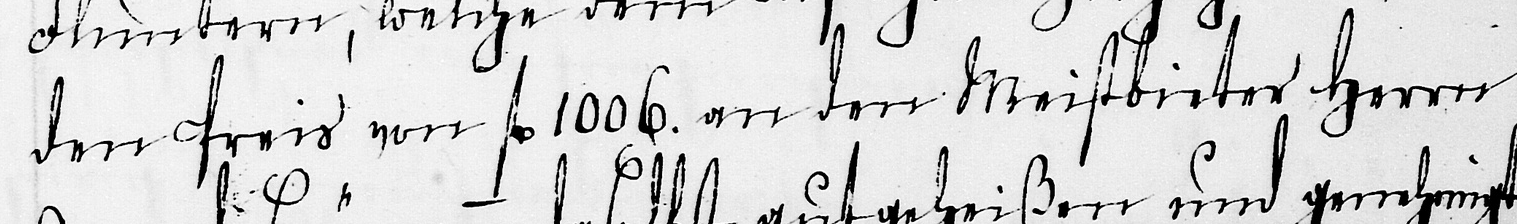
den Preis von fl. 1006. an den Meistbieter Herrn
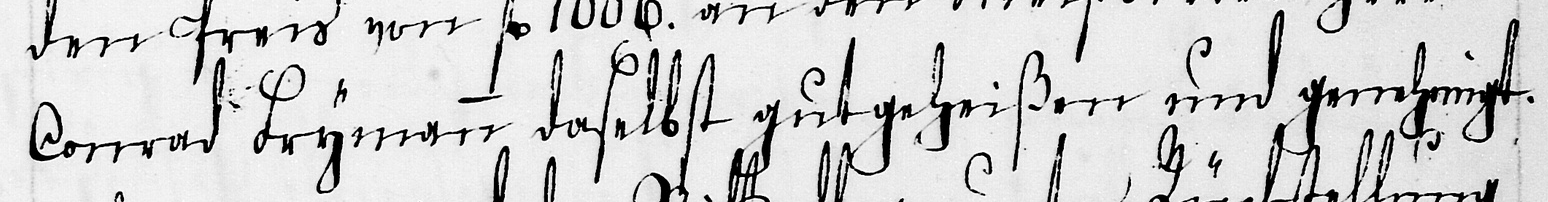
Conrad Frymann daselbst gutgeheißen und genehmigt.
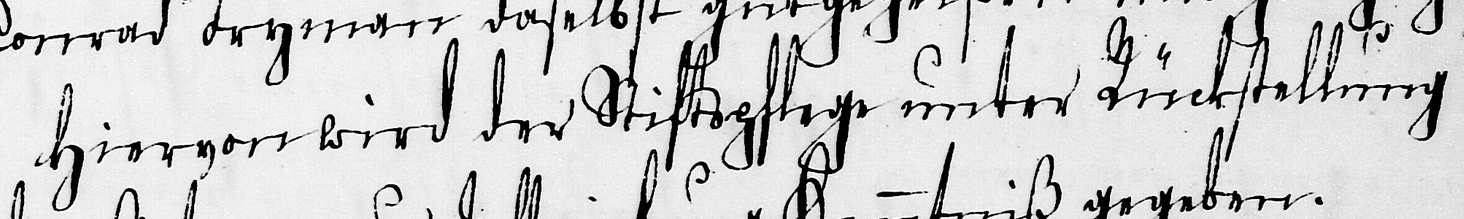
Hiervon wird der Stiftspflege unter Rückstellung
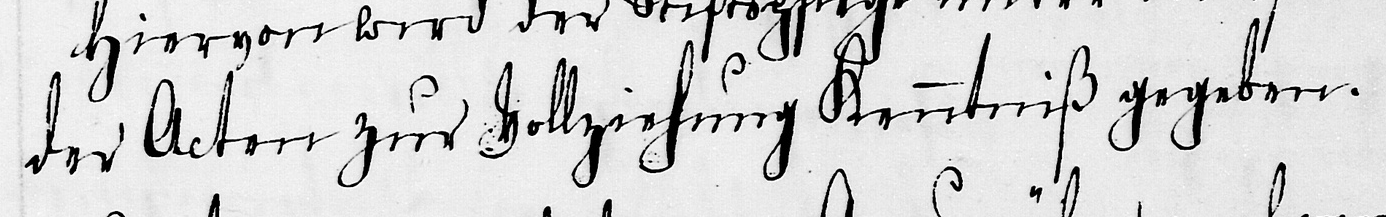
der Acten zur Vollziehung Kenntniß gegeben.
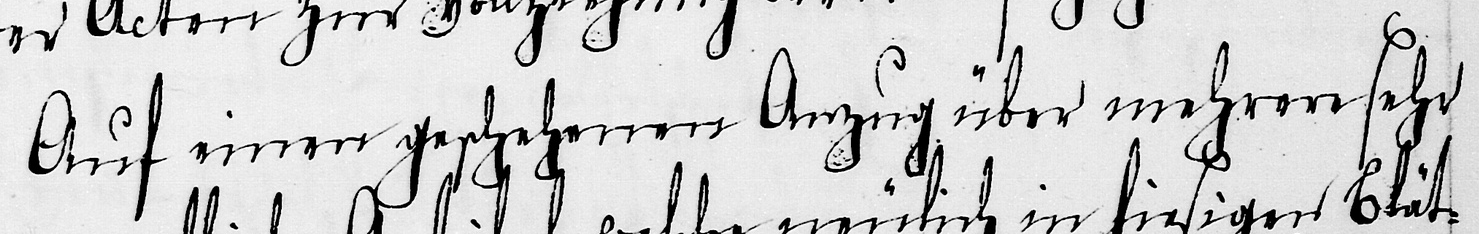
Auf einen geschehenen Anzug über mehrere sehr
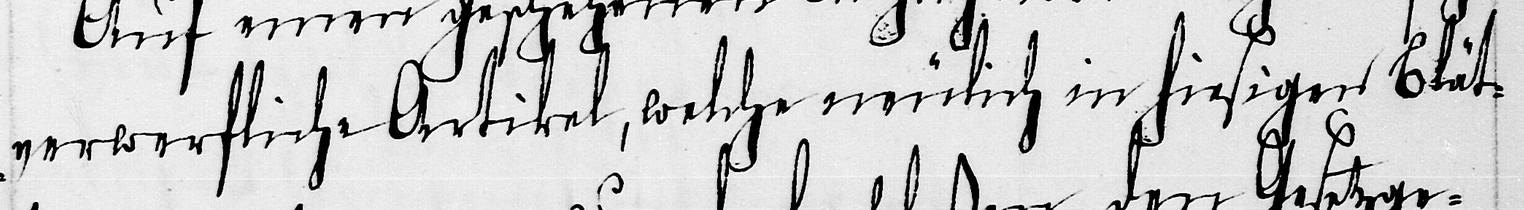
verwerfliche Artikel, welche neulich in hiesigen Blät¬
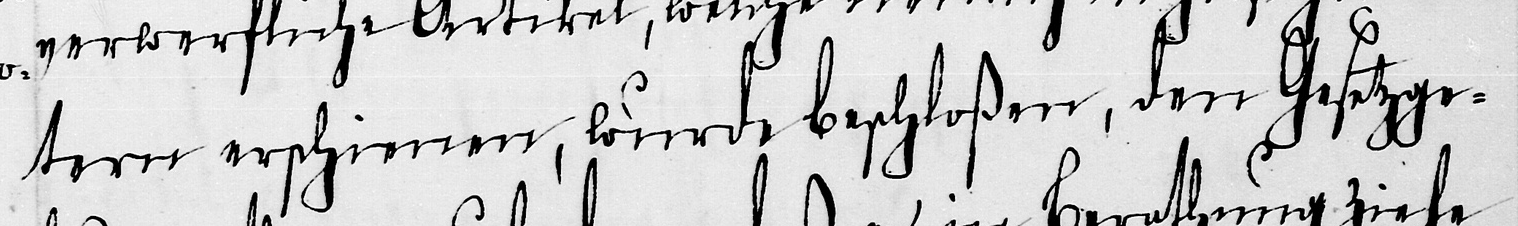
tern erschienen, wurde beschloßen, den Gesetzge¬
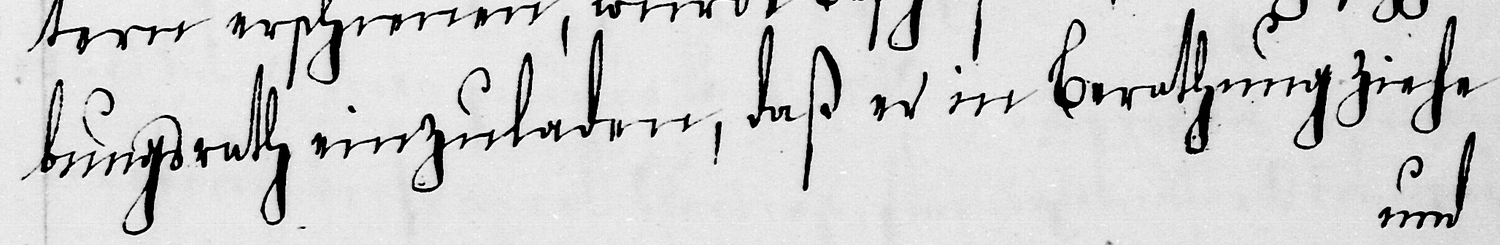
bungsrath einzuladen, daß er in Berathung ziehe
